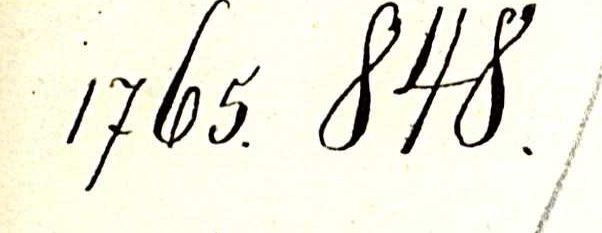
1765. 1848
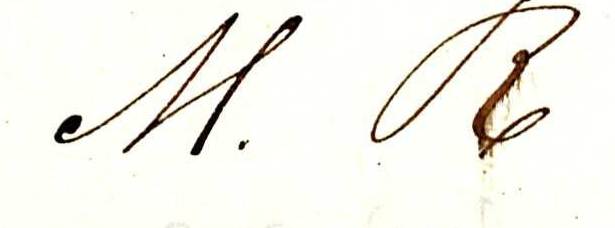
M.R.
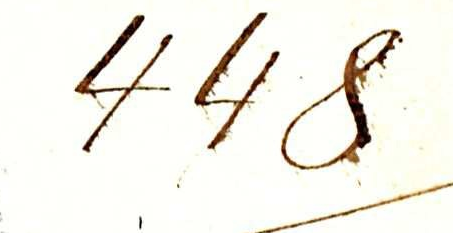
448
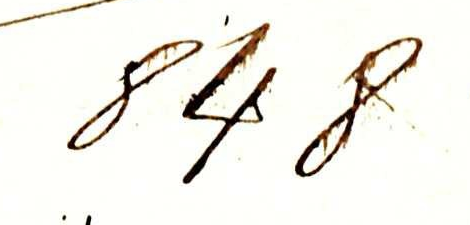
1848
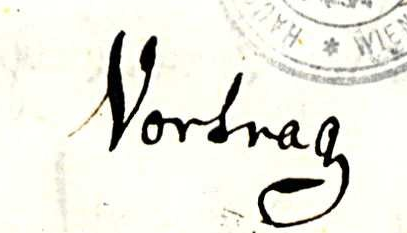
Vortrag
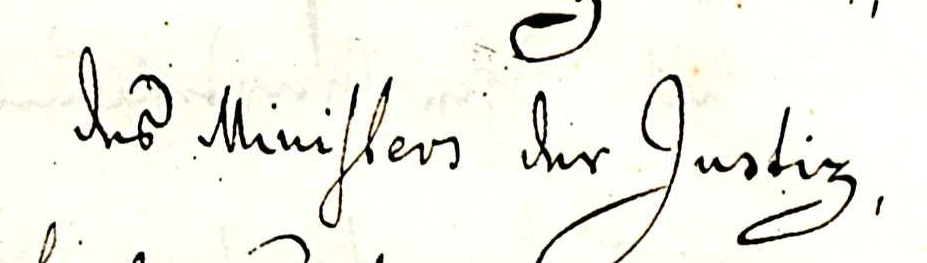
des Ministers der Justiz,
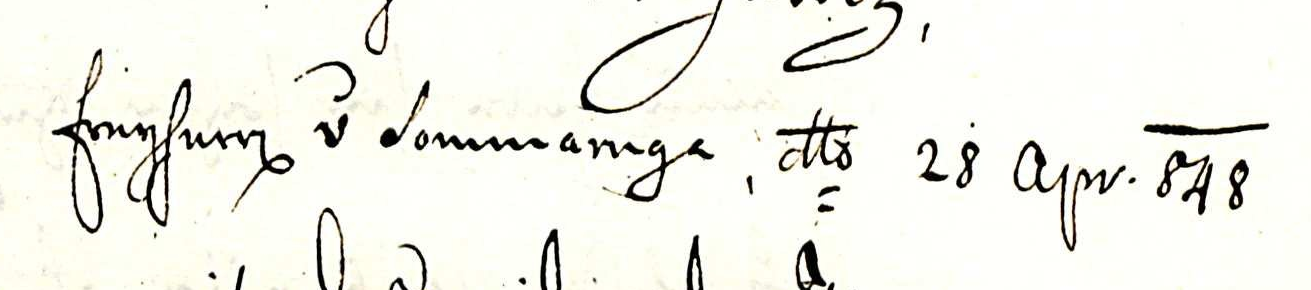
Freyherr v Sommaruga, dto 28 Apr 1848
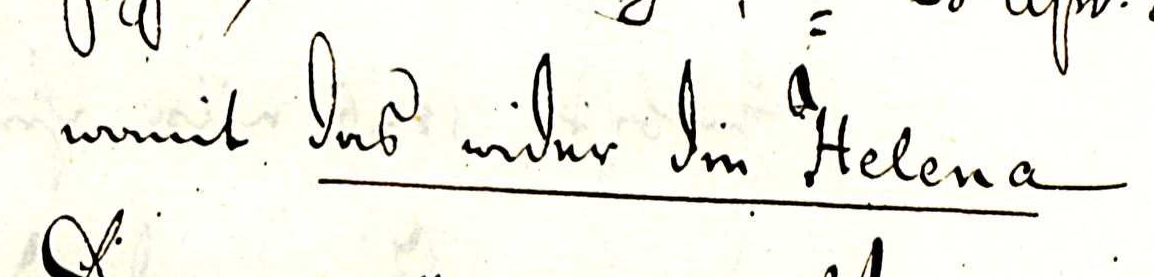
womit das wider die Helena
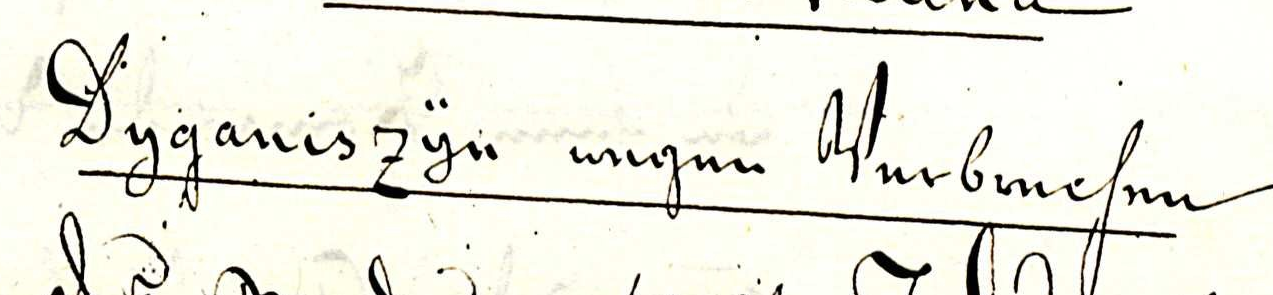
Dyganiszÿn wegen Verbrechen
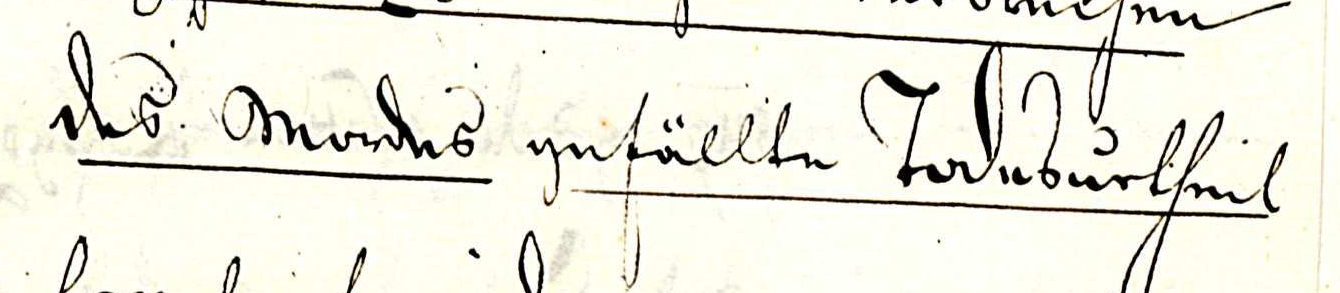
des Mordes gefällte Todesurtheil
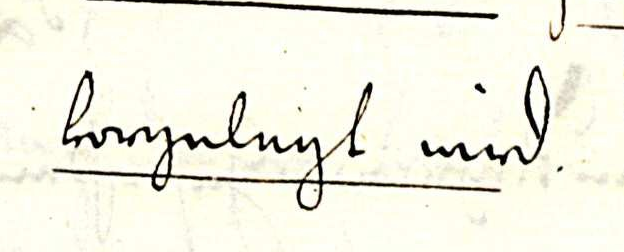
vorgelegt wird.
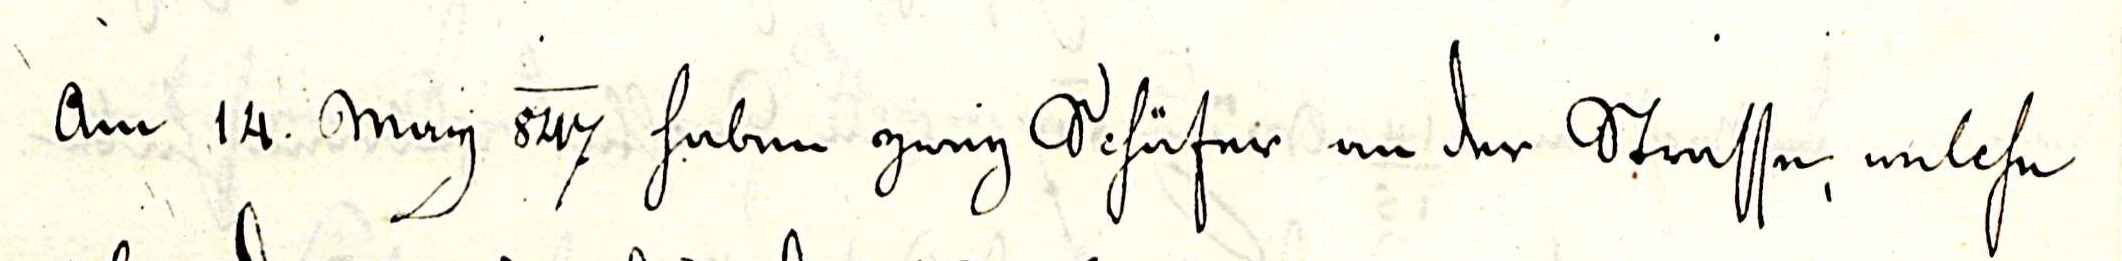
Am 14. May 1847 haben zwey Schäfer an der Strasse, welche
